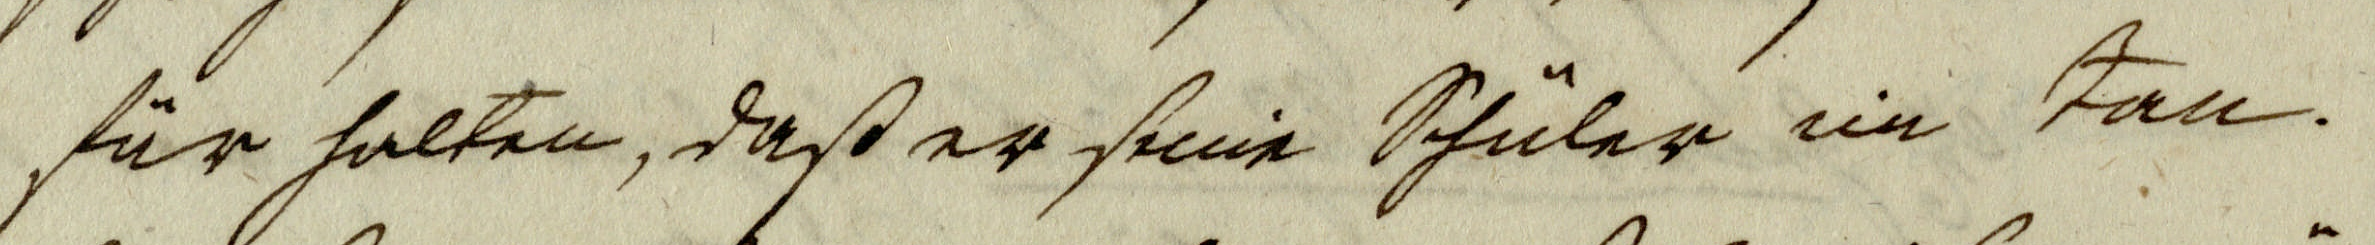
für halten, daß er seine Schüler im Tan¬
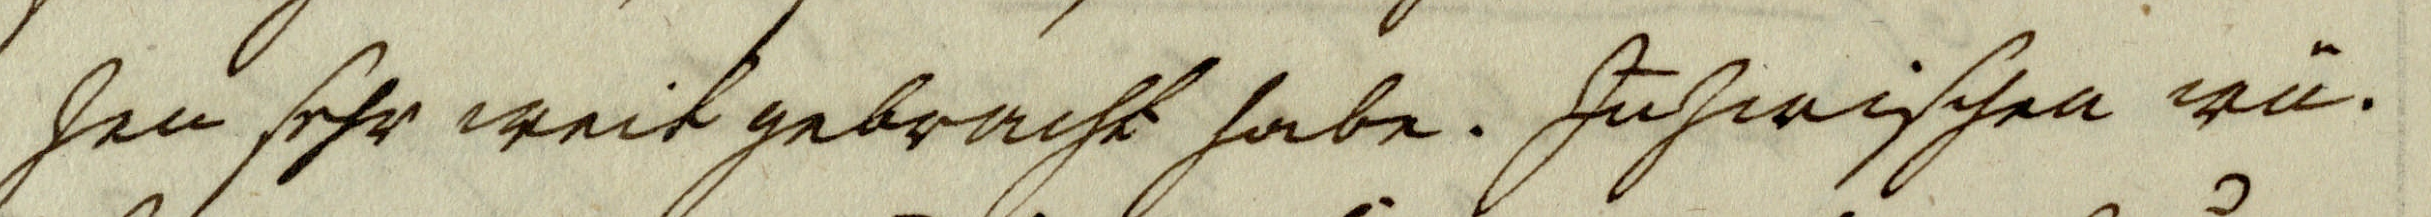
zen sehr weit gebracht habe. Inzwischen wü¬
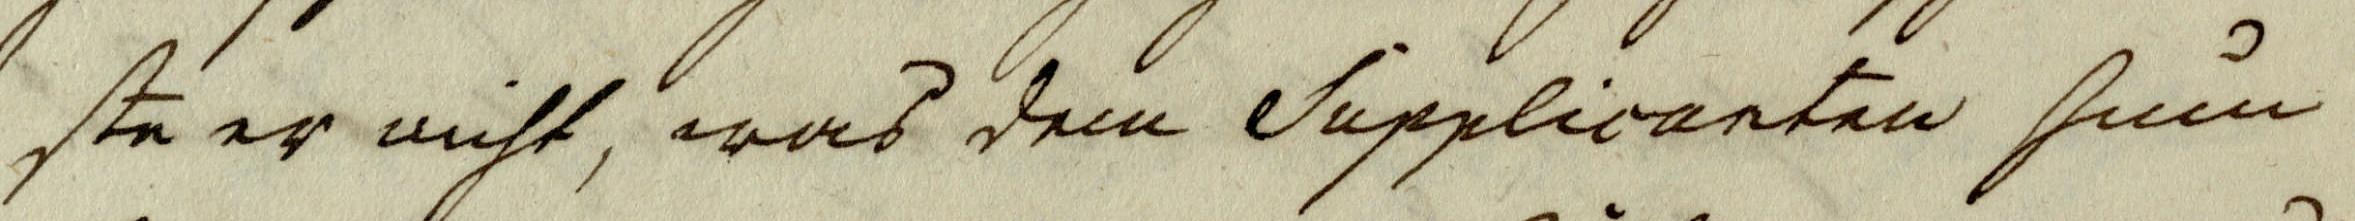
sste er nicht, was dem Supplicanten zum
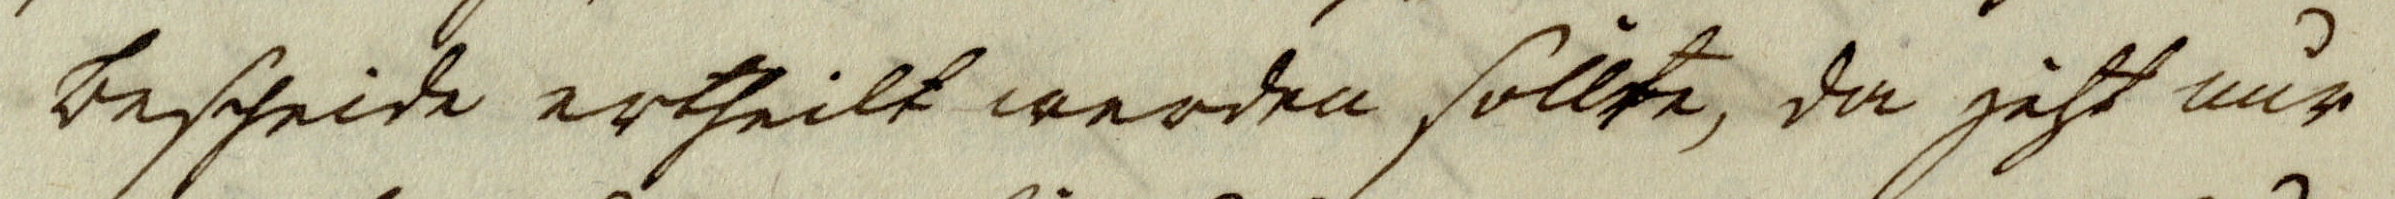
Bescheide ertheilt werden sollte, da jetzt nur
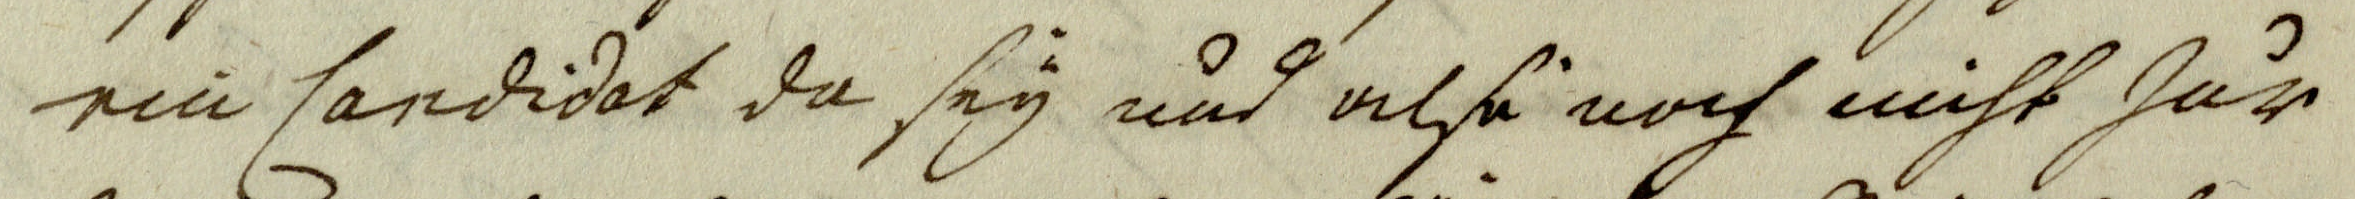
ein Candidat da seÿ und also noch nicht zur
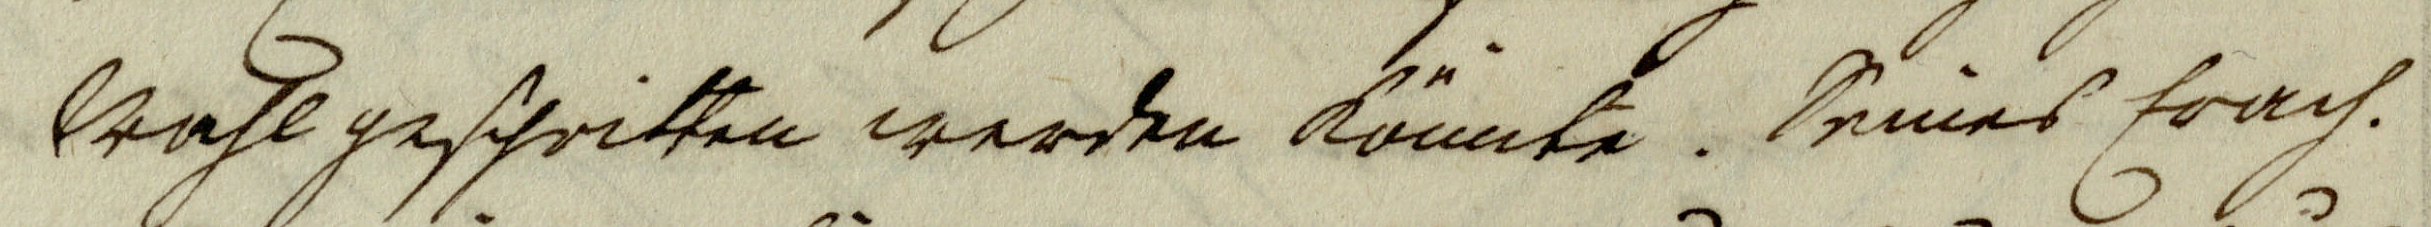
Wahl geschritten werden könnte. Seines Erach¬
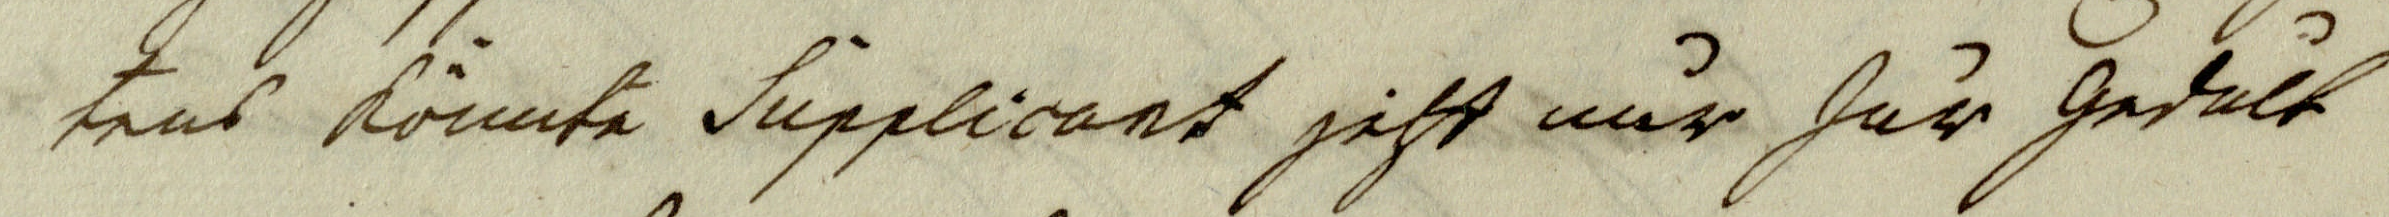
tens könnte Supplicant jetzt nur zur Gedult
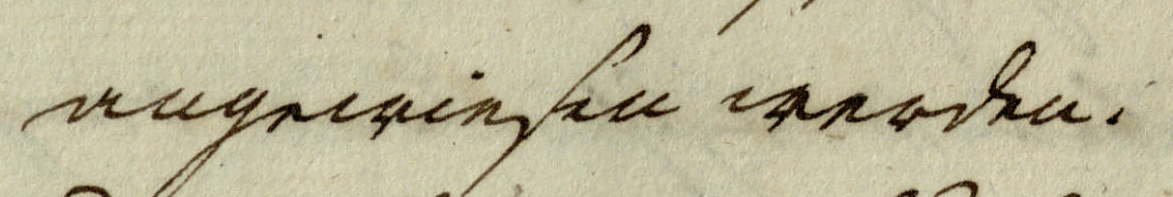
angewiesen werden.
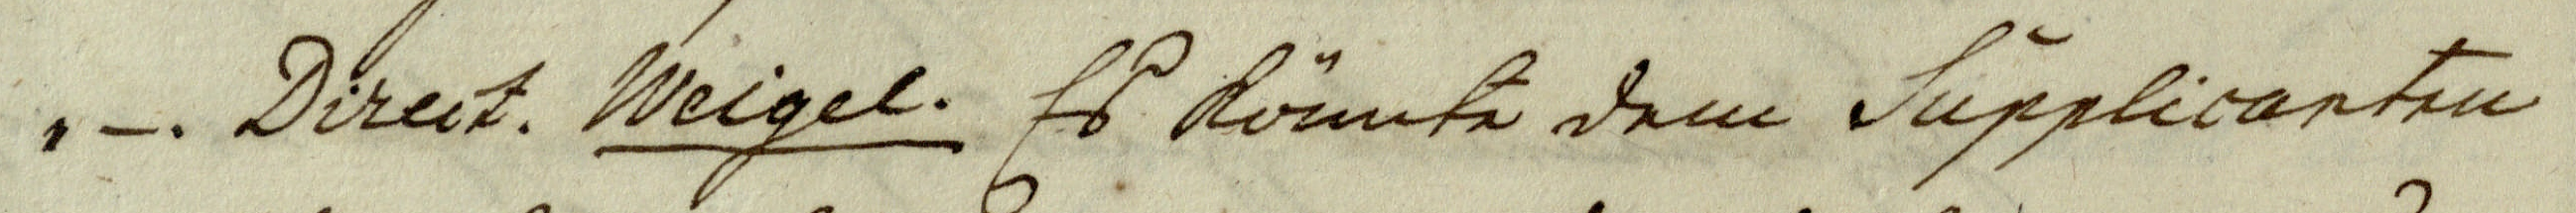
" — . Direct. Weigel. Es könnte dem Supplicanten
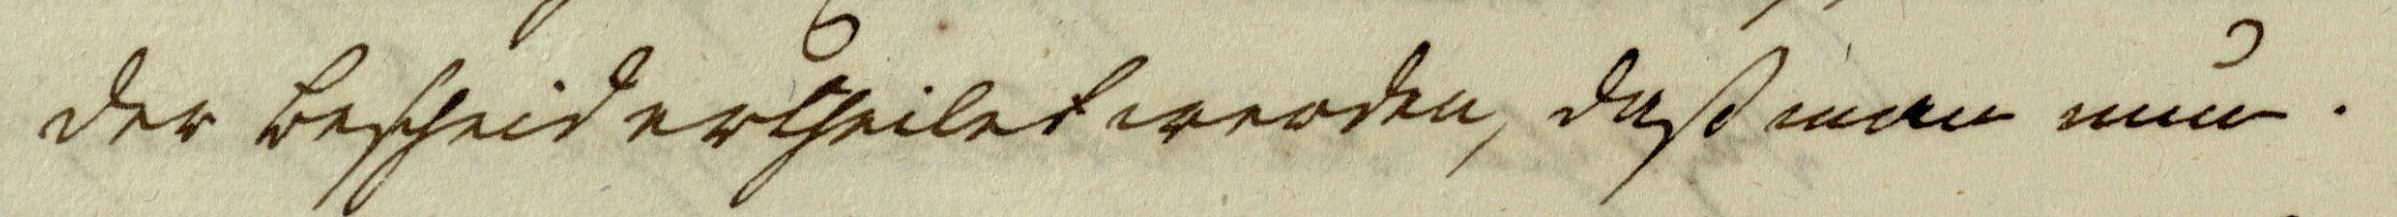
der Bescheid ertheilt werden, daß man nun¬
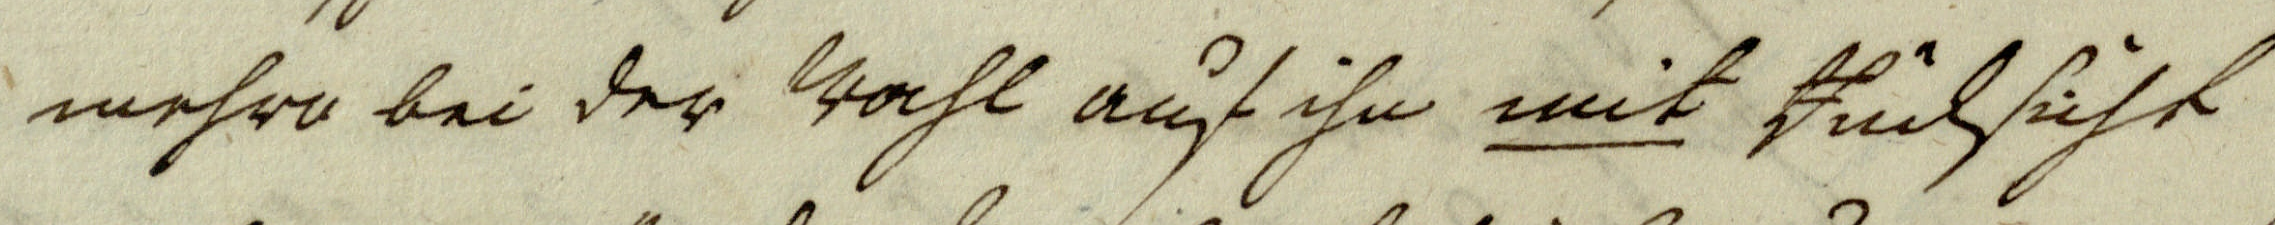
mehro bei der Wahl auf ihn mit Rücksicht
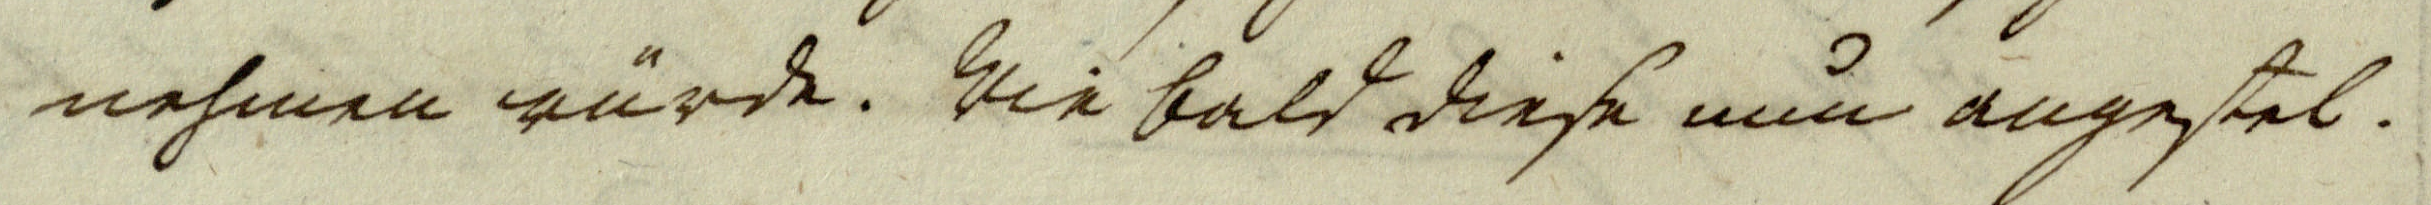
nehmen würde. Wie bald diese nun angestel¬
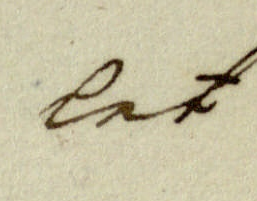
let
